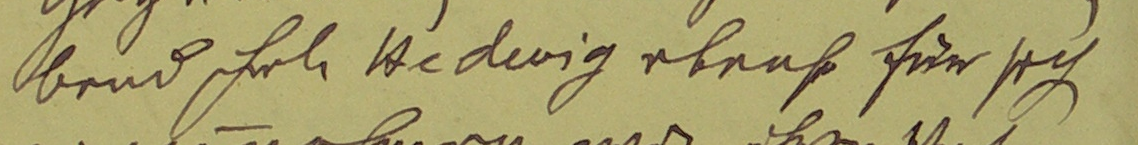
bend Frl Hedwig ebenso für sich
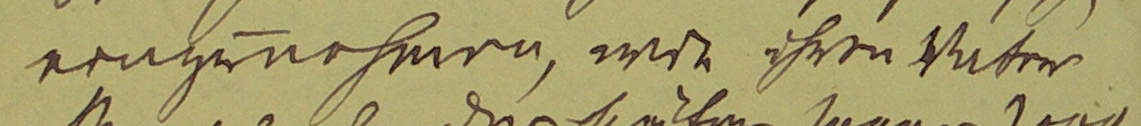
einzunehmen, wie ihren Vater
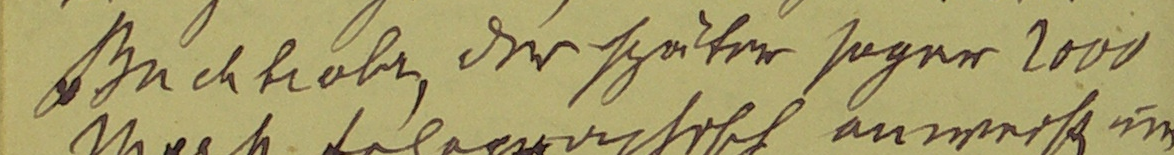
Buchholz, der später sogar 2000
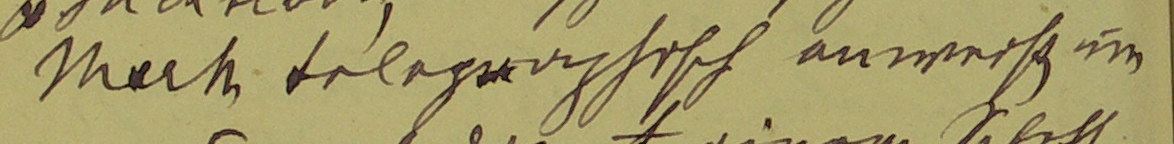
Mark telegraphisch anweist um
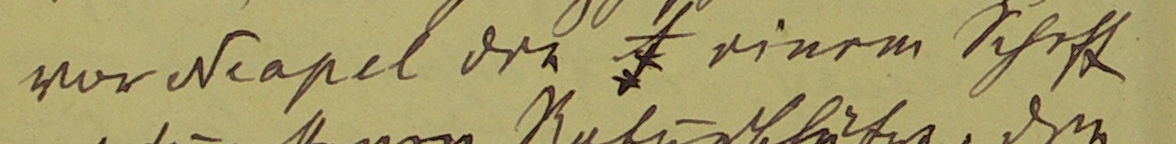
vor Neapel die mit einem Schiff
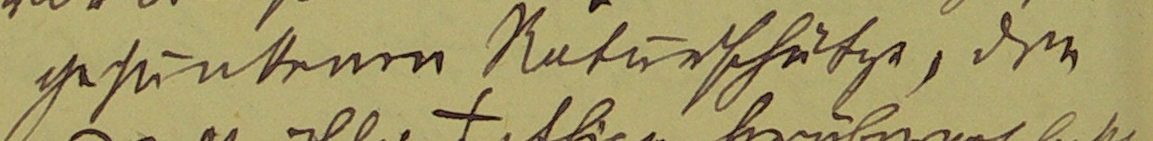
gekommenen Naturschätze, die
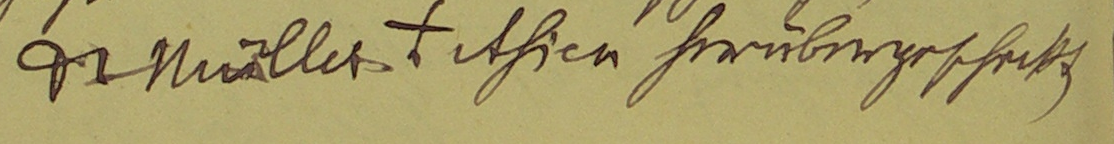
Dr. Miller aus Asien herübergeschickt
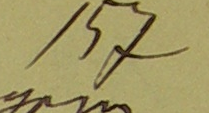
157
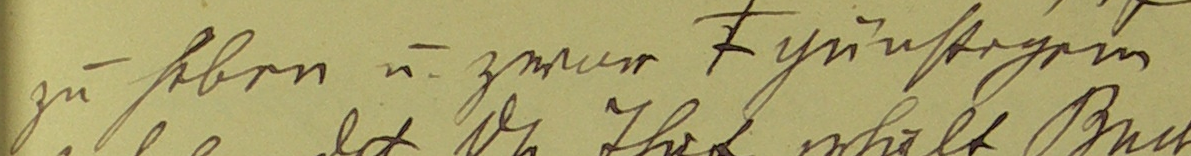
zu heben und zwar mit günstigem
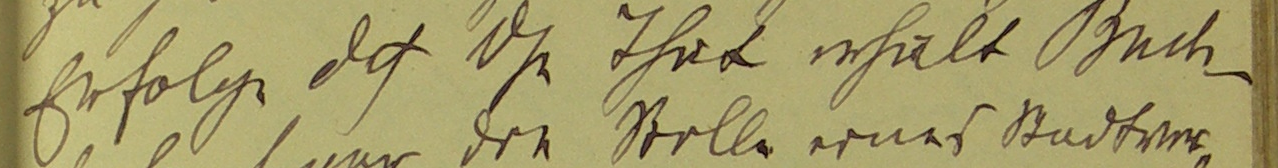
Erfolg. Durch diese That erhält Buch¬
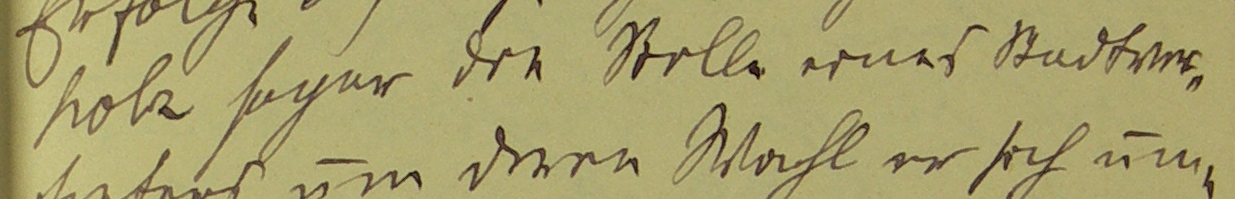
holz sogar die Stolle eines Stadtver¬
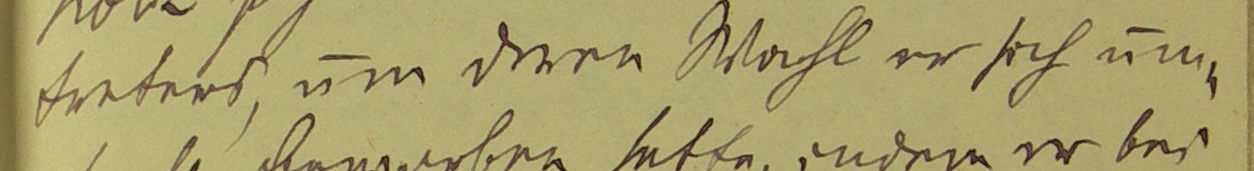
treters, um deren Wahl er sich um¬
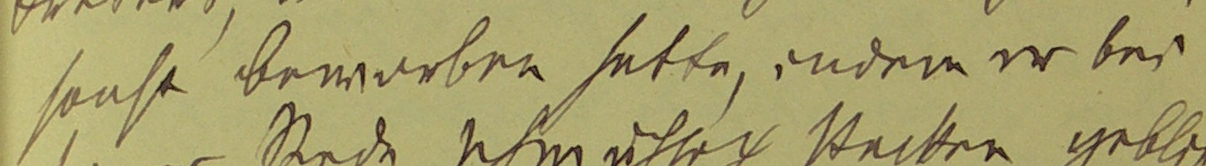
sonst beworben hatte indem er bei
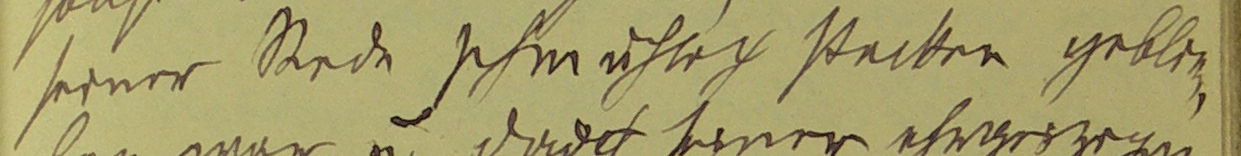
seiner Rede sichtlig stecken geblie¬
